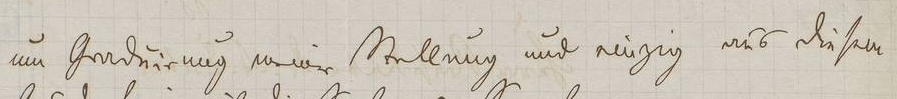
um Graduirung meiner Stellung und einzig aus diesem
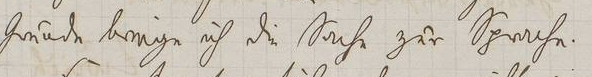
Grunde bringe ich die Sache zur Sprache.
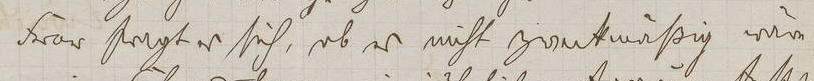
Ferner fragt es sich, ob es nicht zweckmäßig wäre,
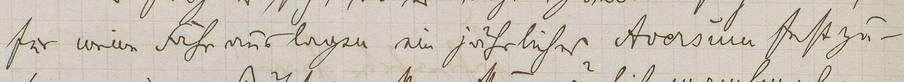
für meine Fahrauslagen ein jährliches Aversum festzu-
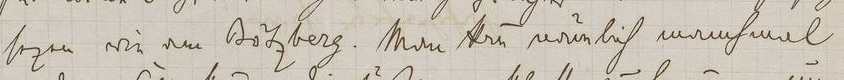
sezen wie am Bötzberg. Man kann nämlich manchmal
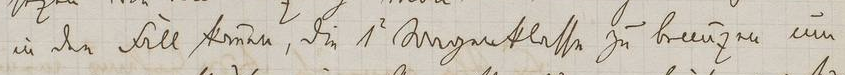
in den Fall kommen, die 1t Wagenklasse zu benüzen um
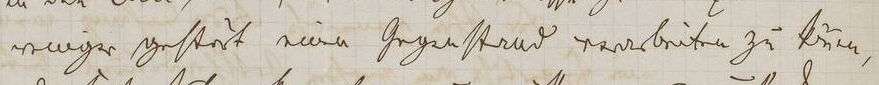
weniger gestört einen Gegenstand erarbeiten zu können,
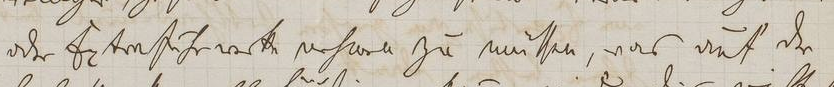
oder Externfuhwerke nehmen zu müssen, was auf der
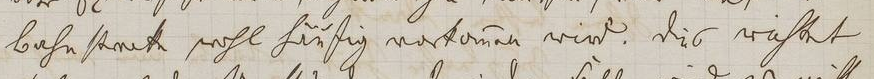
Bahnstrecke wohl häufig vorkommen wird. Dies richtet
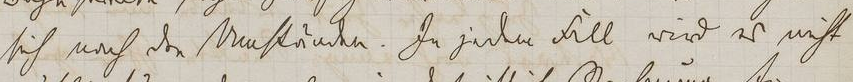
sich nach den Uständen. In jedem Fall wird es nicht
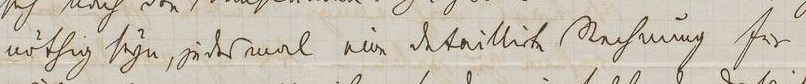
nöthig seyn, jedesmal eine detaillirte Rechnung für
